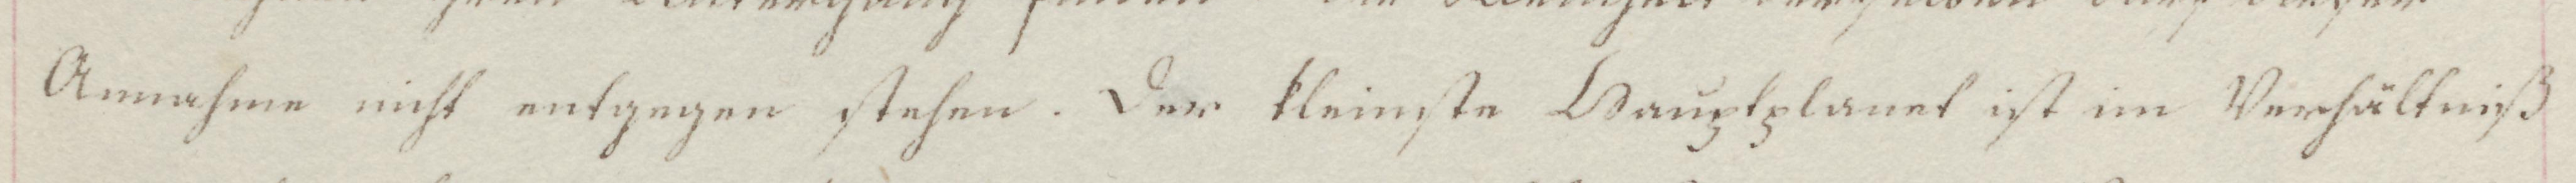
Annahme nicht entgegen stehen. Der kleinste Hauptplanet ist im Verhältniß
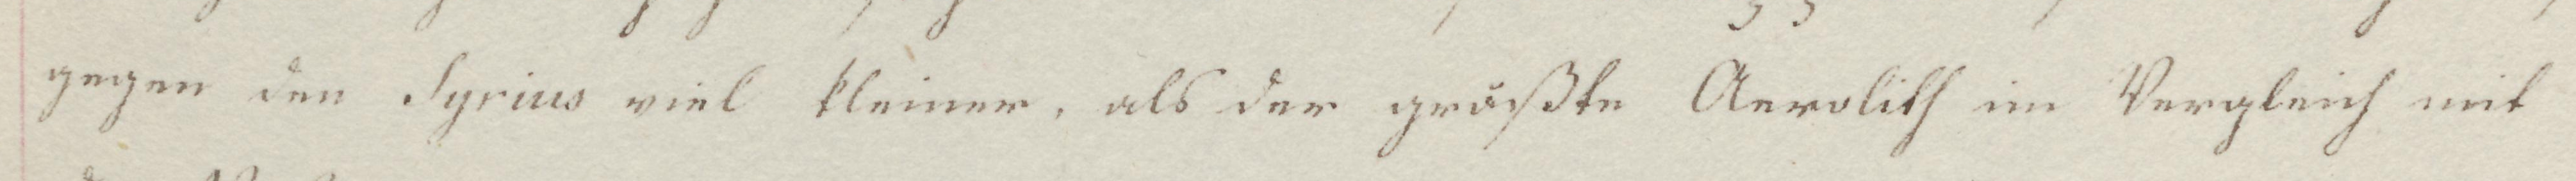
gegen den Syrius viel kleiner als der größte Aerolith im Vergleich mit
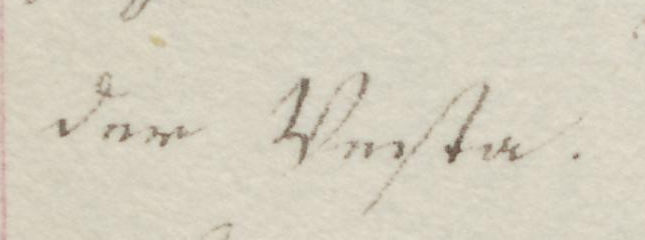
der Vesta.
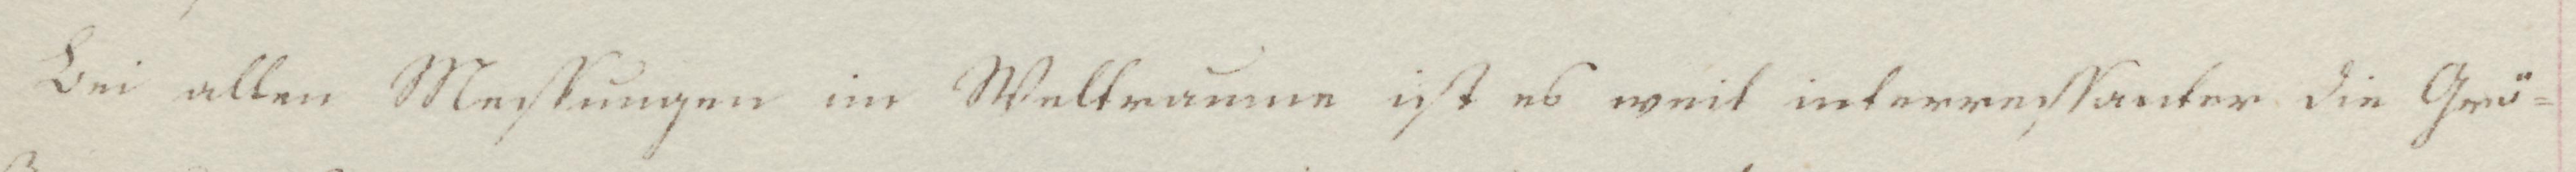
Bei allen Messungen im Weltraume ist es weit interressanter die Grö-
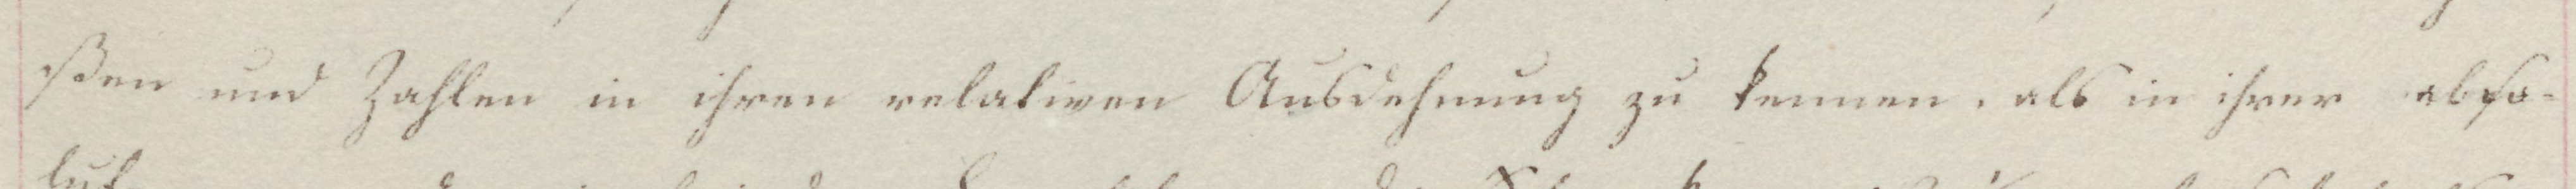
ßen und Zahlen in ihrer relativen Ausdehnung zu kennen, als in ihrer abso-
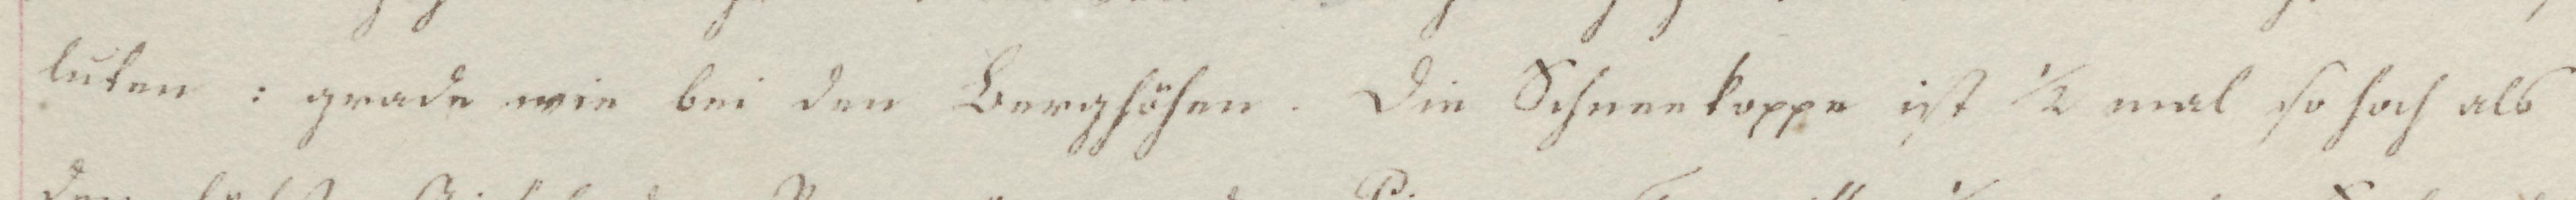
luten: gerade wie bei den Berghöhen. Die Schneekoppe ist ½ mal so hoch als
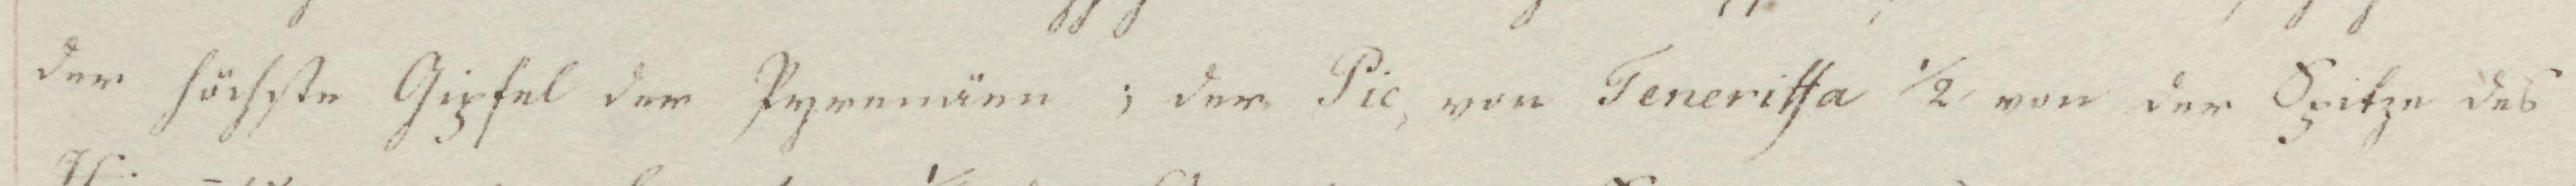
der höchste Gipfel der Pyrenäen; der Pic von Teneriffa ½ von der Spitze des
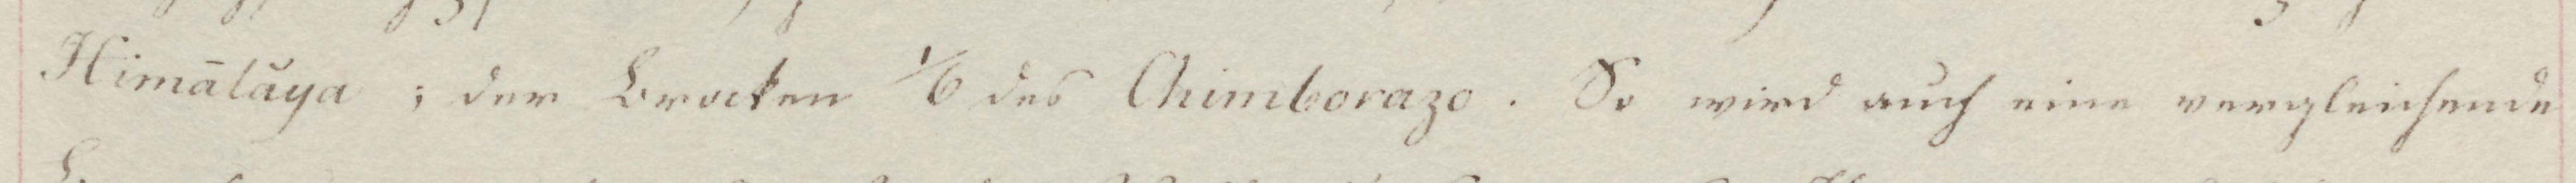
Himālăya; der Brocken ⅙ des Chimborazo. So wird auch eine vergleichende
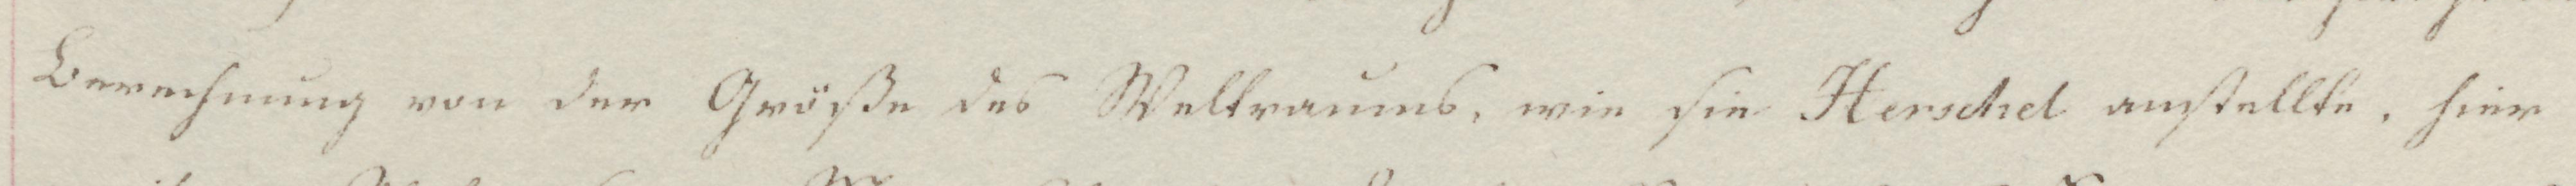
Berechnung von der Größe des Weltraums, wie sie Herschel anstellte, hier
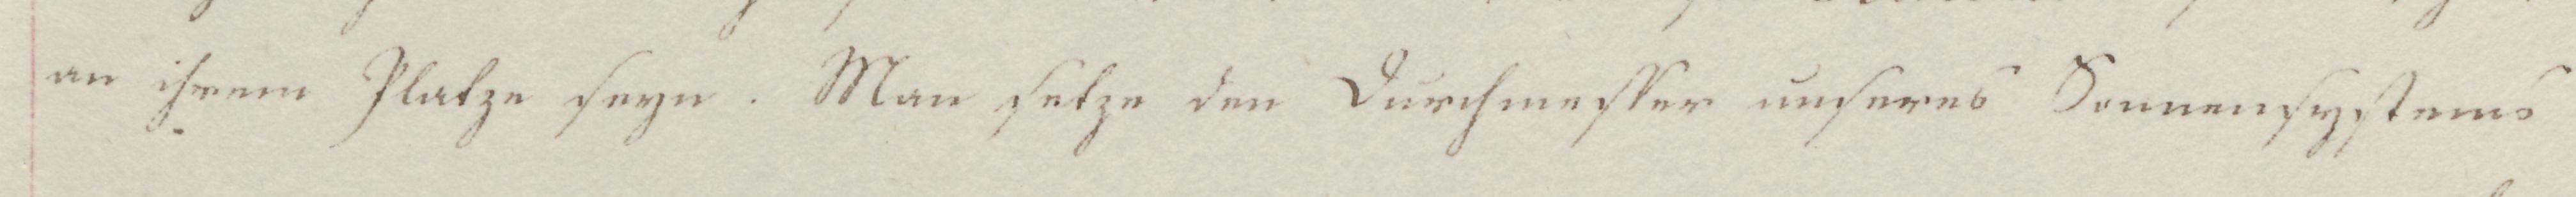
an ihrem Platze seyn. Man setze den Durchmesser unseres Sonnensystems
